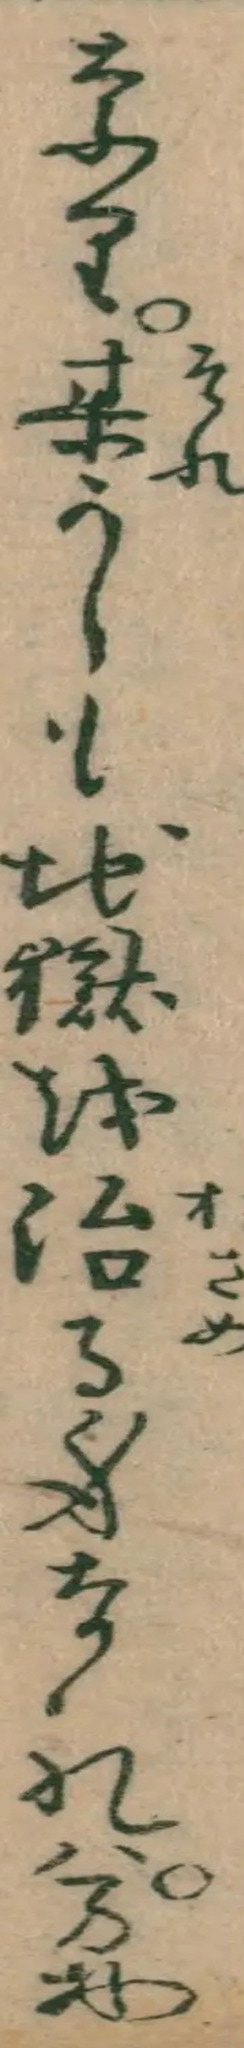なり。某かしも地獄を治る身なれは。万物
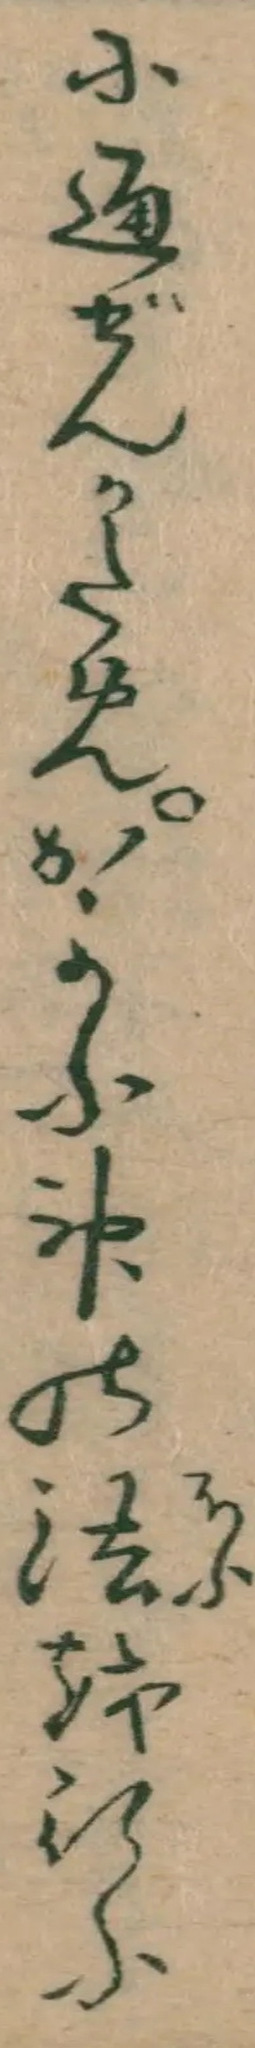に通ぜんかため。かよふ神の法を行ふ
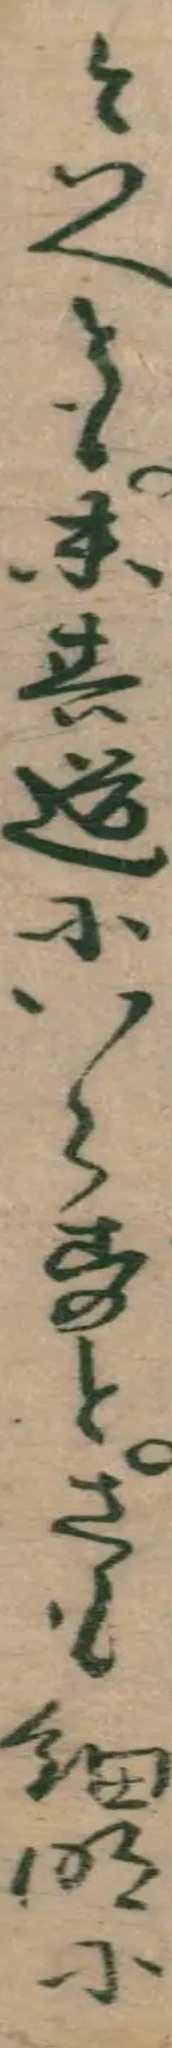といへとも。未其道にいらすと。さも細明に
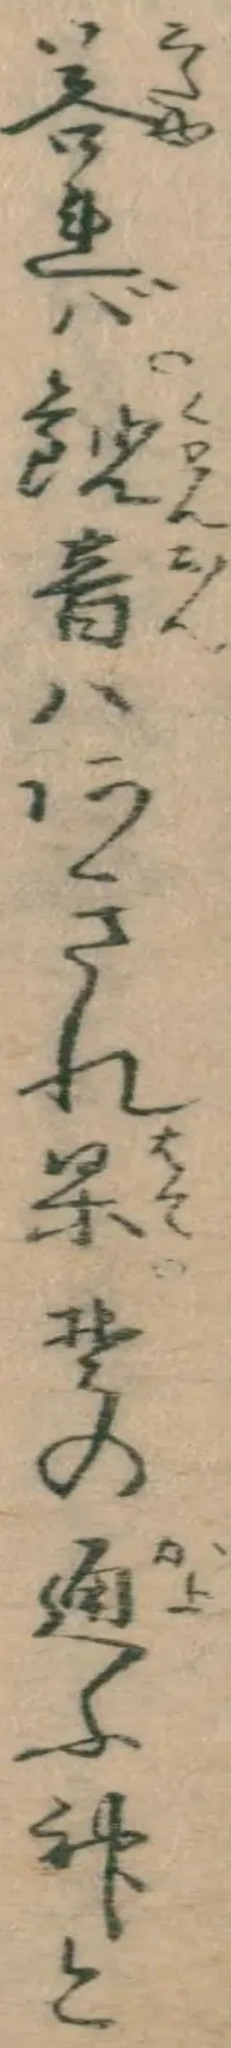答れば。観音はあきれ果その通ふ神と
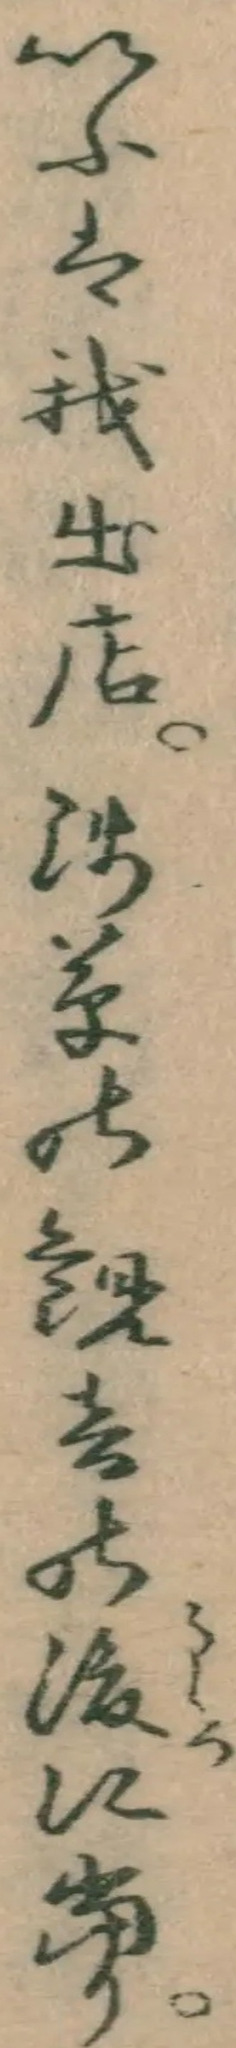いふは我出店。浅草の観音の後に当り。
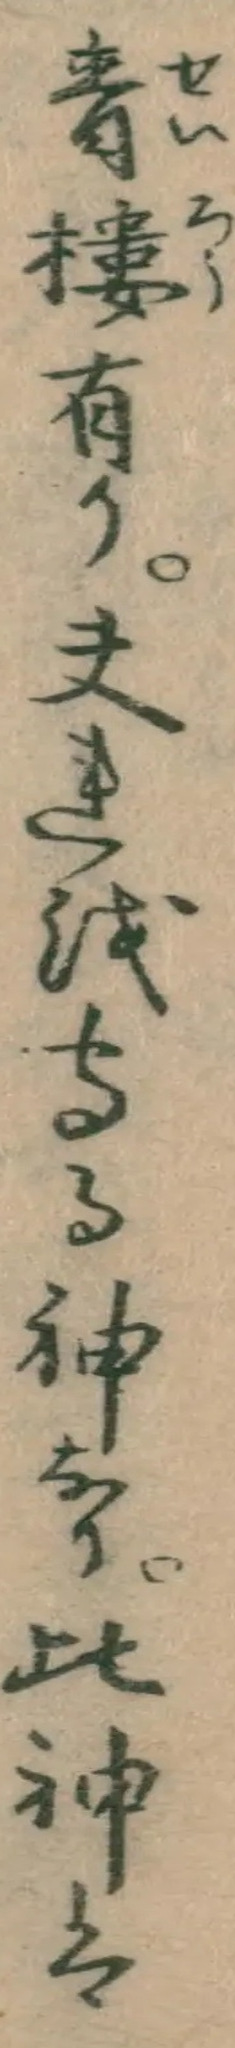青楼有り。夫れを守る神なり。此神は
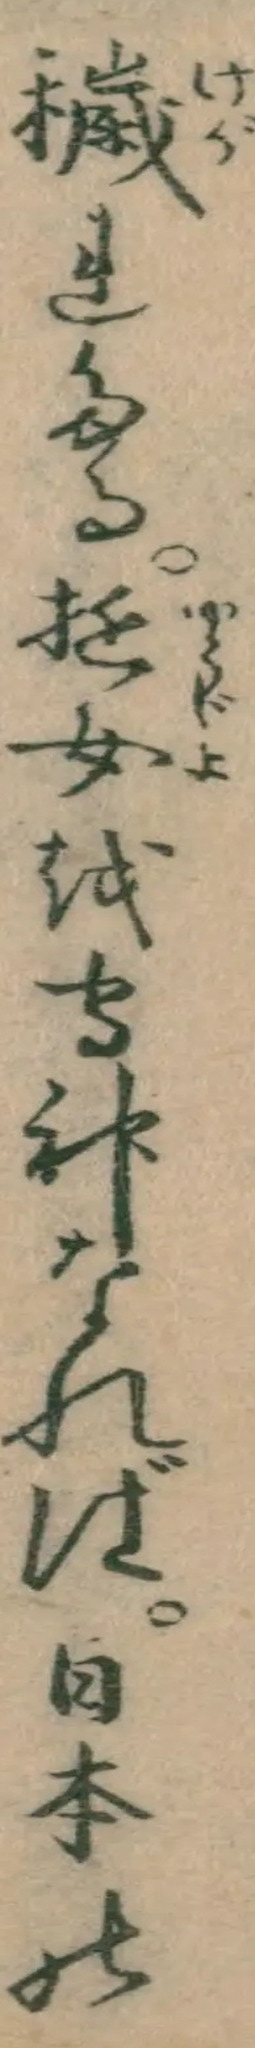穢れたる。遊女を守神なれば。日本の
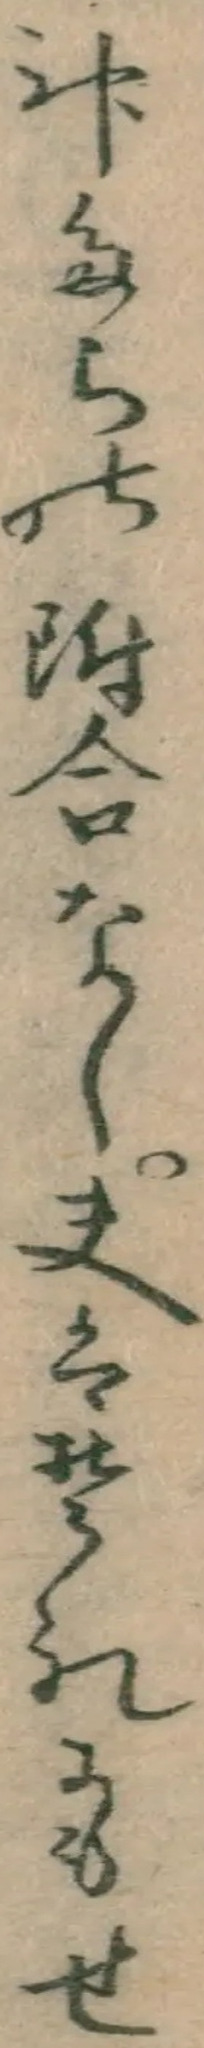神たちの付合なし。夫はそれにもせ
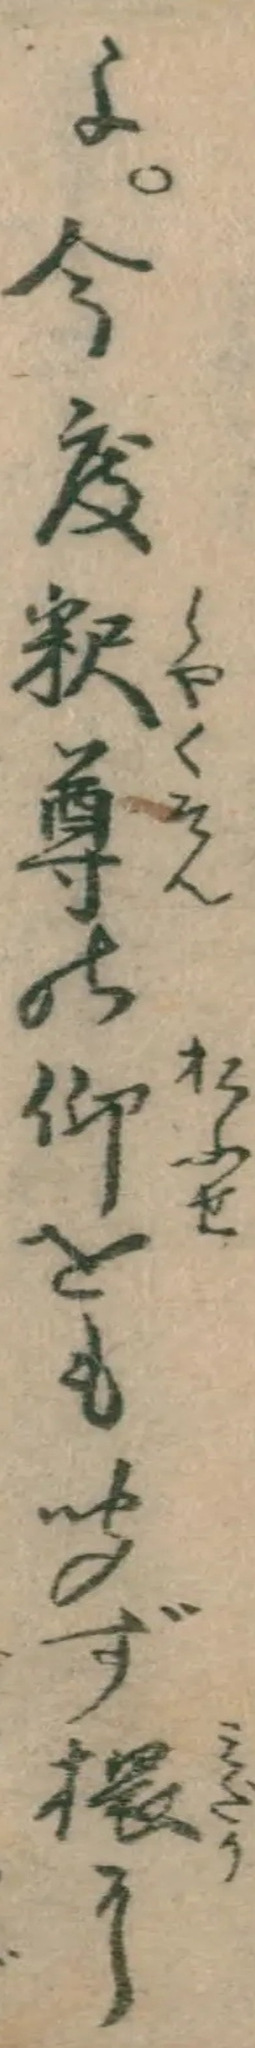よ。今度釈尊の仰をも聞ず猥に
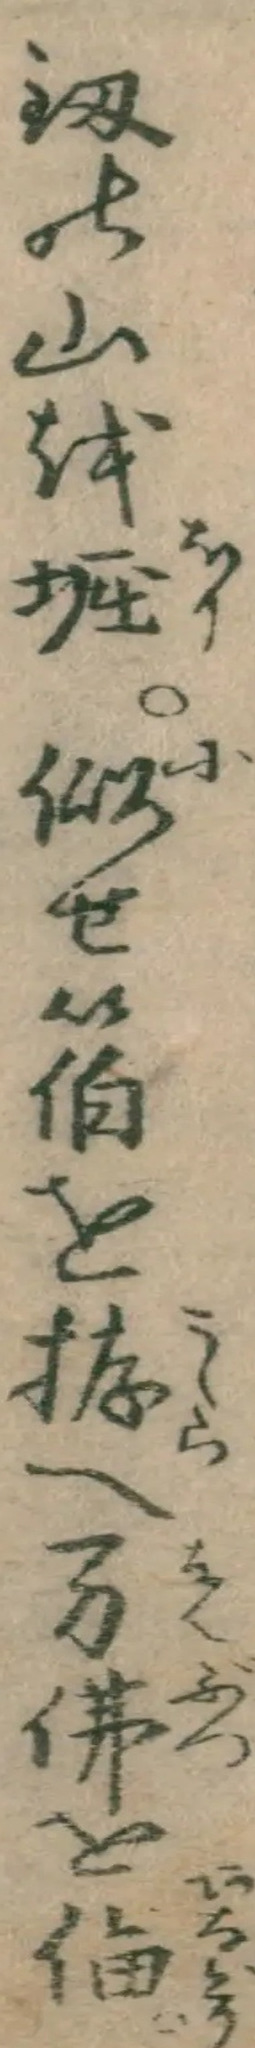釼の山を堀。似せ箔を拵へ万仏を侮
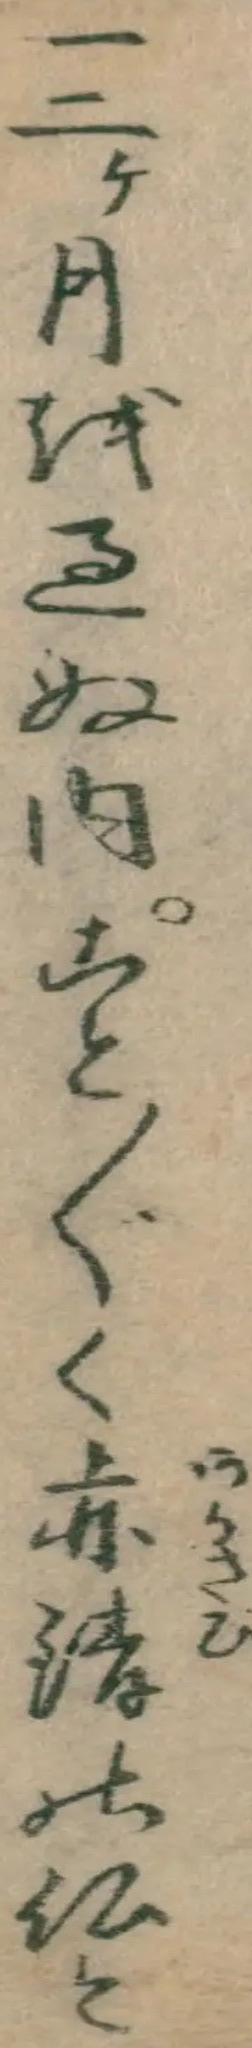一二ヶ月を過ぬ内。こと〴〵く赤錆の仏と

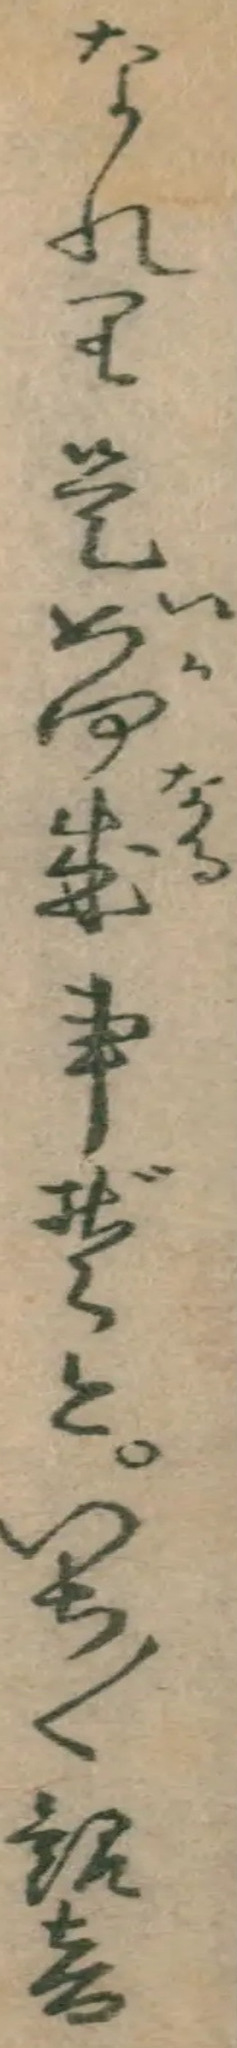なれり是如何成事ぞと。いち〳〵観音
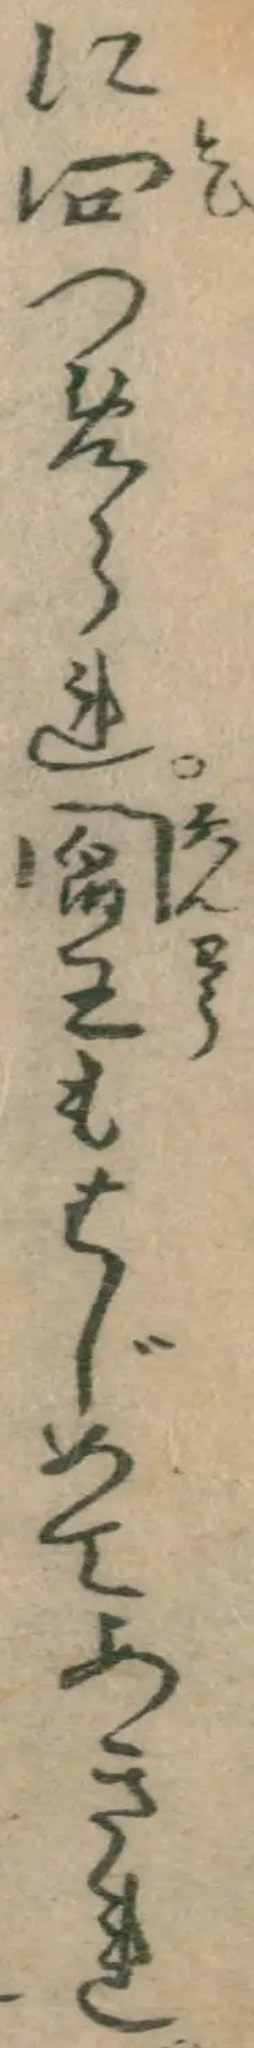に問つめられ。閻王もはじめてあきれ。
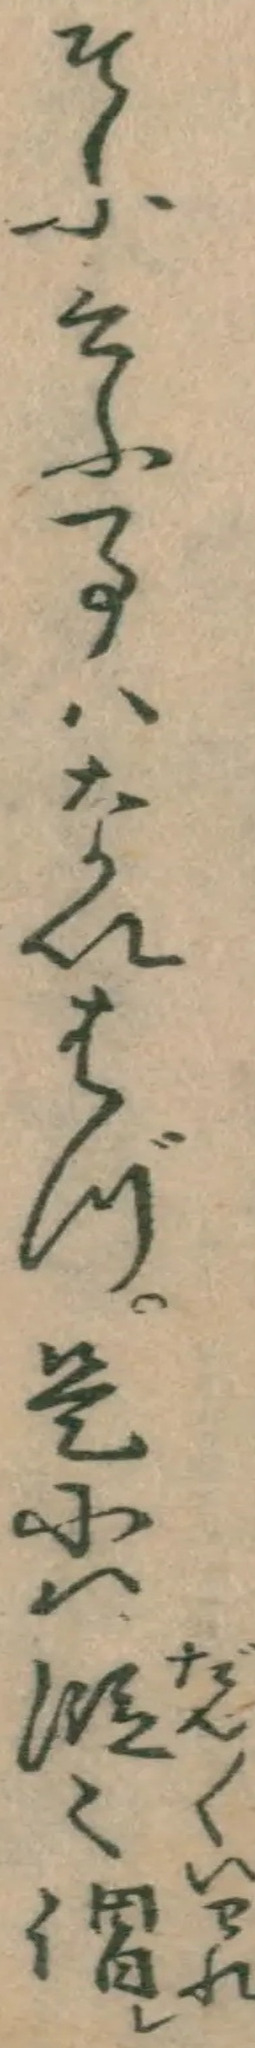そふ言ふ事はないはづ。是には段々謂
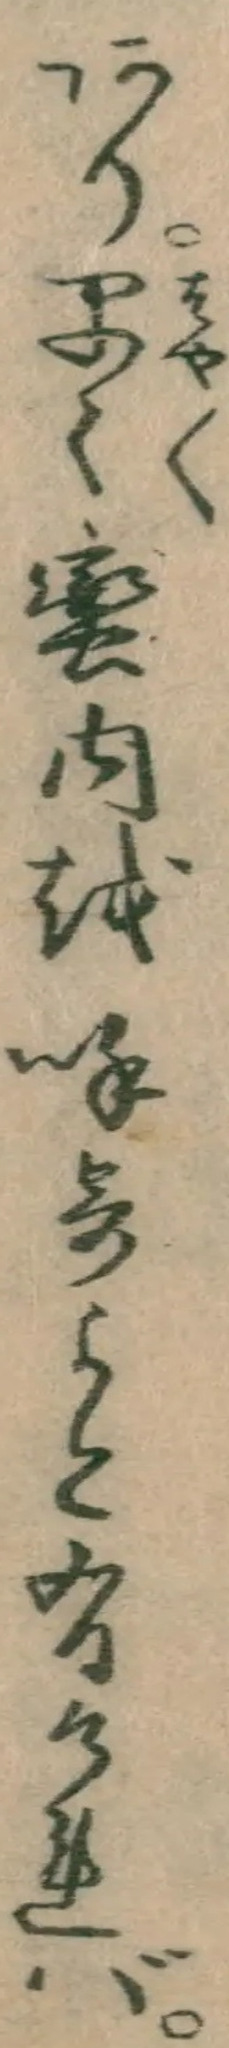あり。早〳〵蛮内を呼寄よと有ければ。
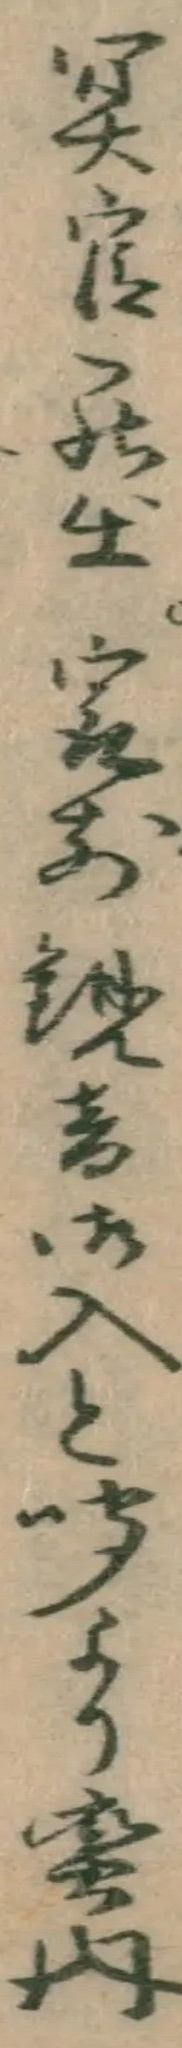冥官罷出。最前観音御入と聞より蛮内
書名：翻草盲目
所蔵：国立国会図書館 National Diet Library, JAPAN
